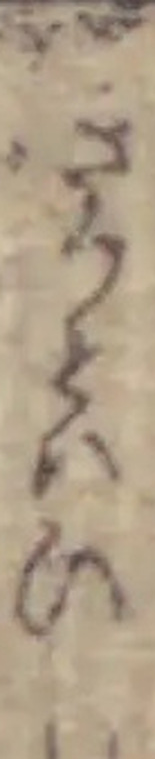さりとはひ
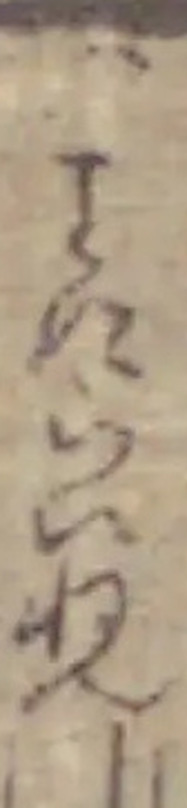ことにらいねん
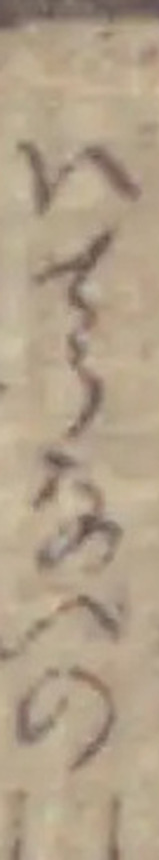はてうないの
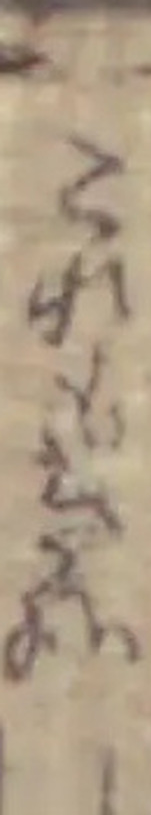これもき様
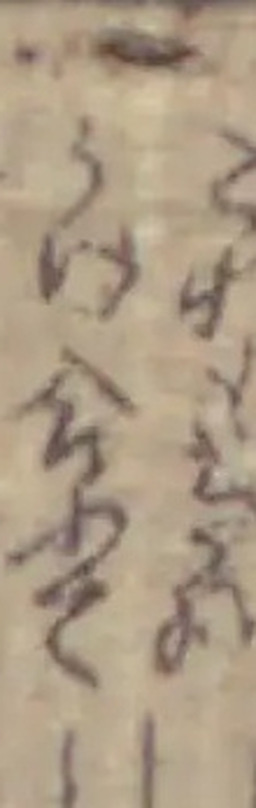うけ合ふて
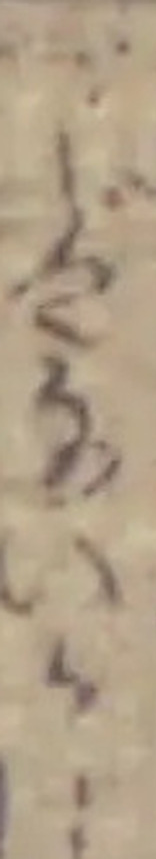じやないか
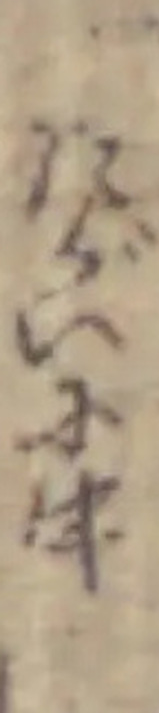たがいに中
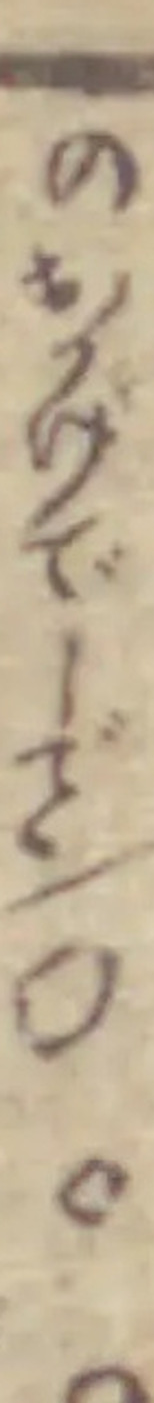のおかけでしごと
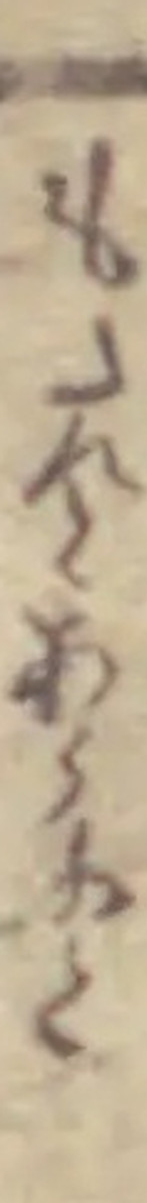もたんとあらふと
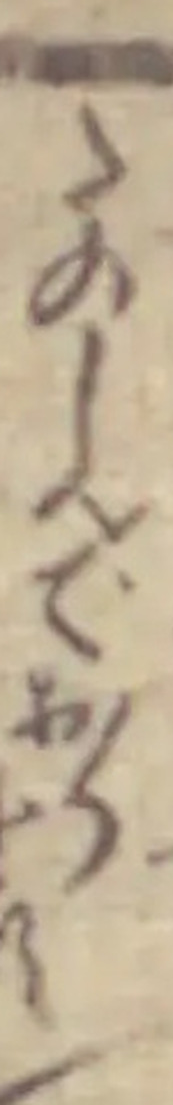たのしんでおります
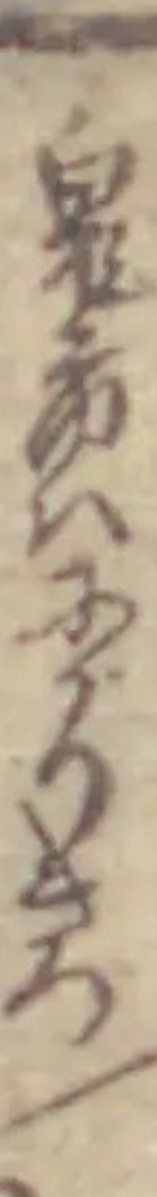鬼市はにがりきつ
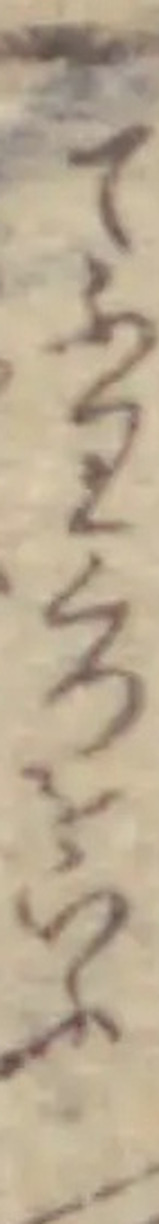てふりくつをいふ
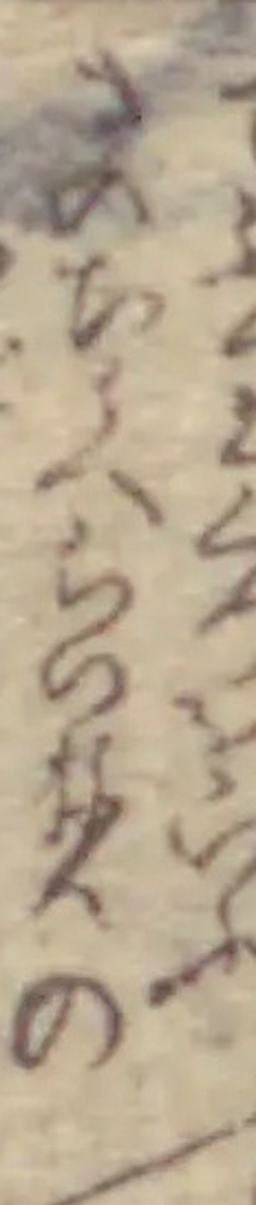さいちうへらいねんの
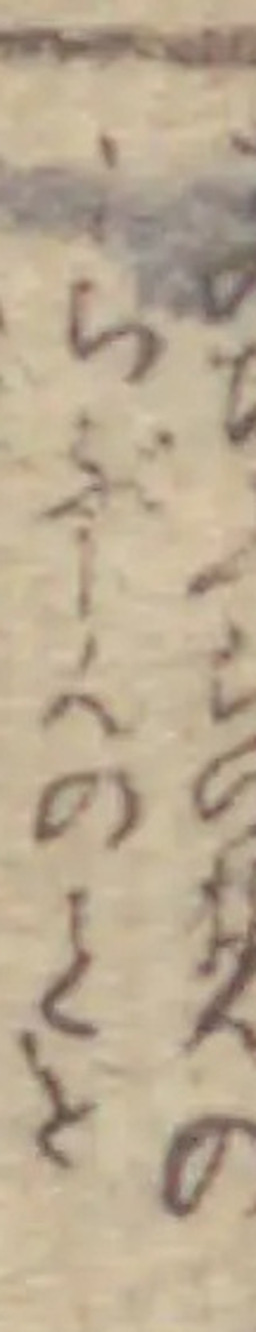みちぶしんのことを
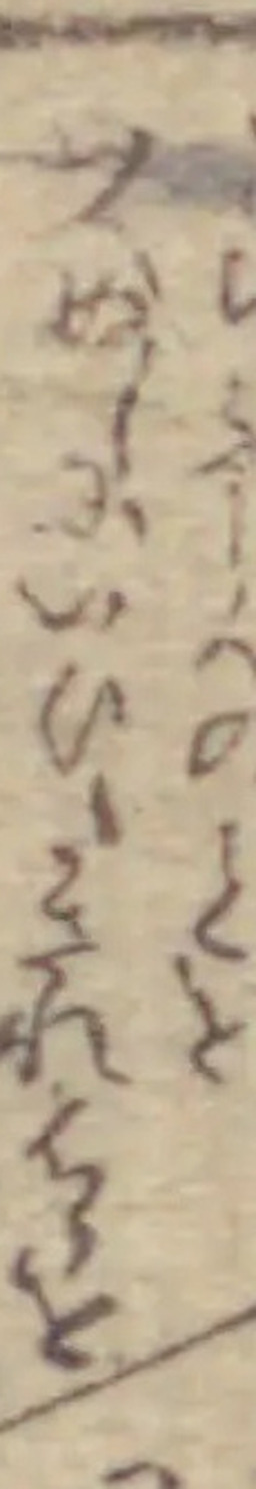いへぬしにいひたされはらを
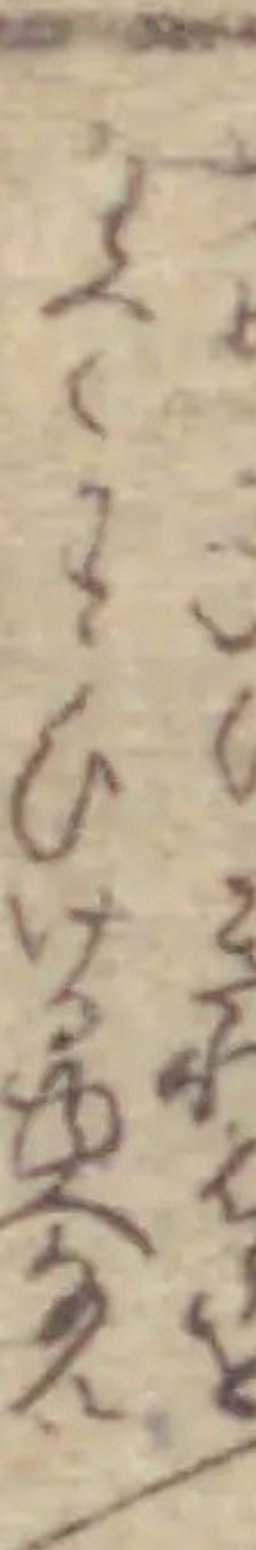かゝへてわらひけるゆへなん
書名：鬼子宝 3巻
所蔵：国立国会図書館 National Diet Library, JAPAN
